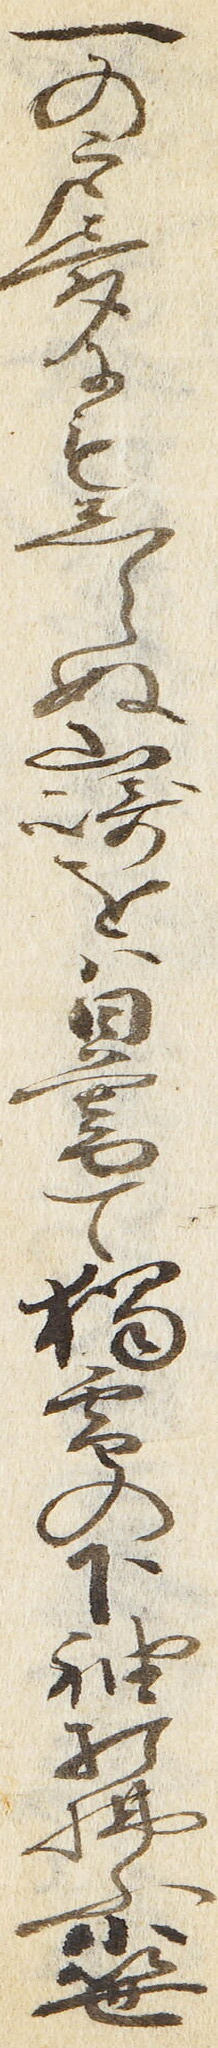一の戸夢にもしらぬ山崎をは日暮て独雪の下袖打払ふ小笹
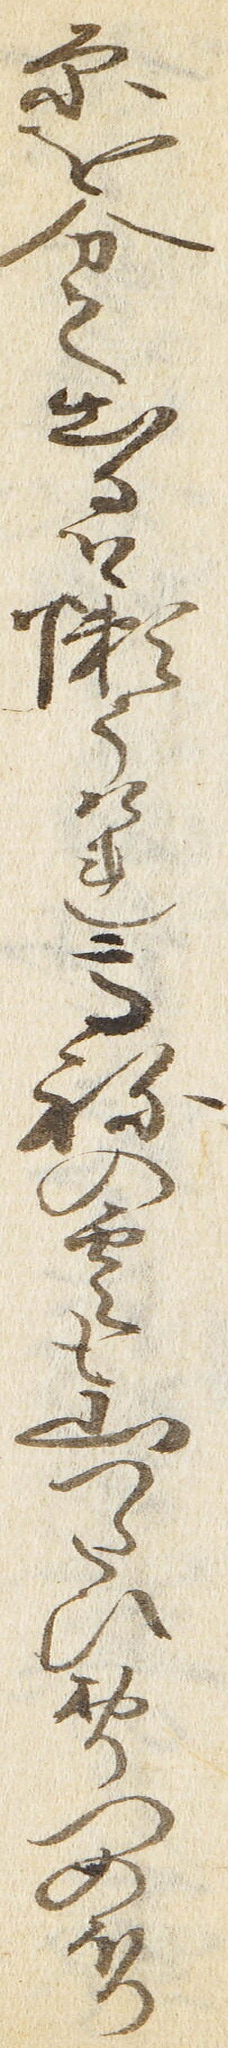原を分て出るそ懶うけれ高ねの雲も山つたひおりつのほり
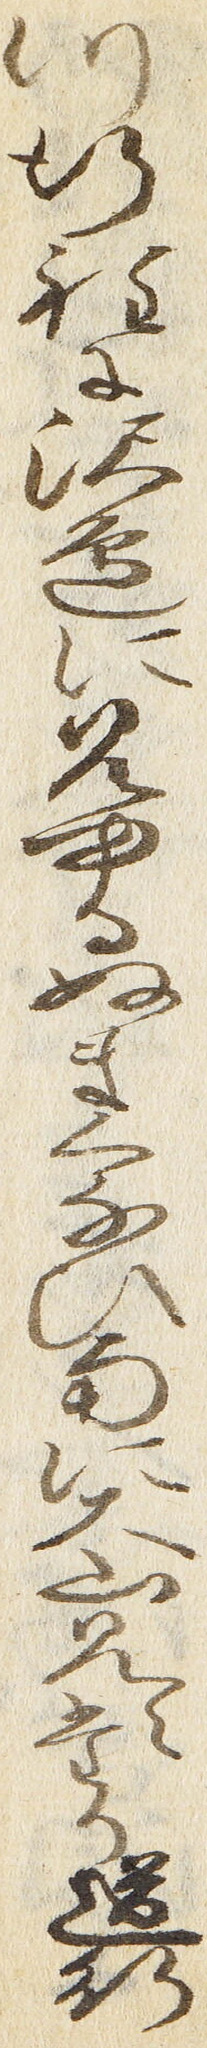つ行程に沢辺に見ゆるぬまくなひ南に大山見えたり道行
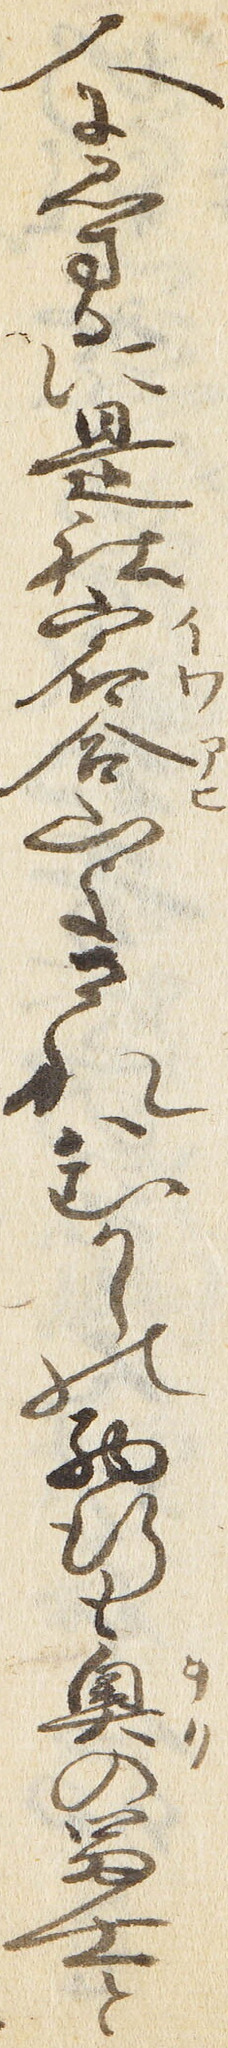人に尋るに是社岩合山よされはむかしの西行も奥の富士と
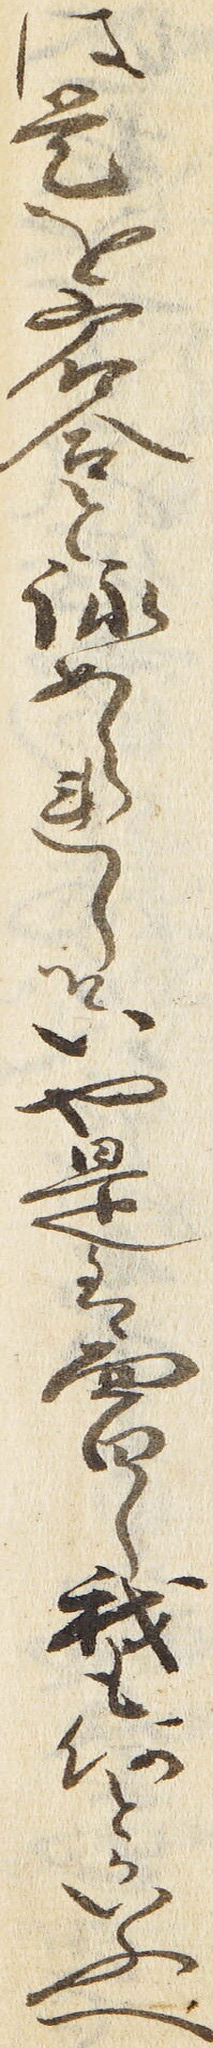は是を岩合と詠められしそいや是は面白し我も何とかいふへ
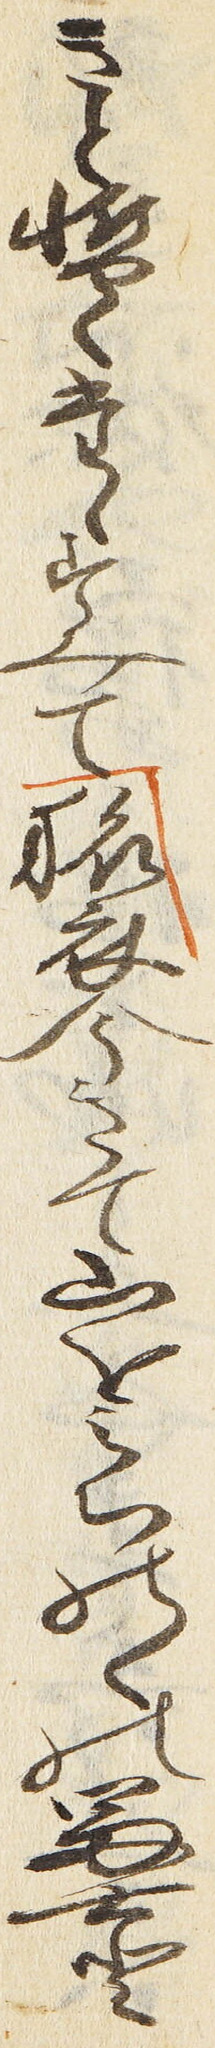きと暫くたたすみて「旅衣今きて山をみちのくの富士と
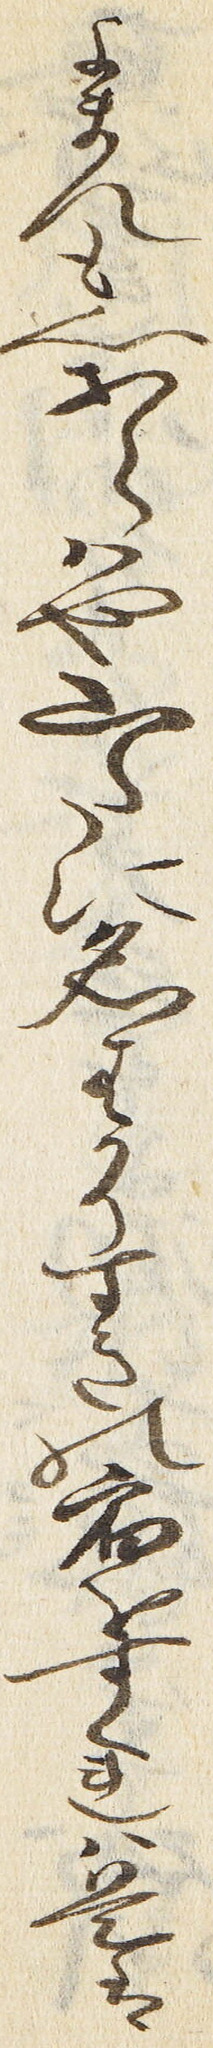よまんも心あらはや山たに名はかりすきの宿をすくれは是は
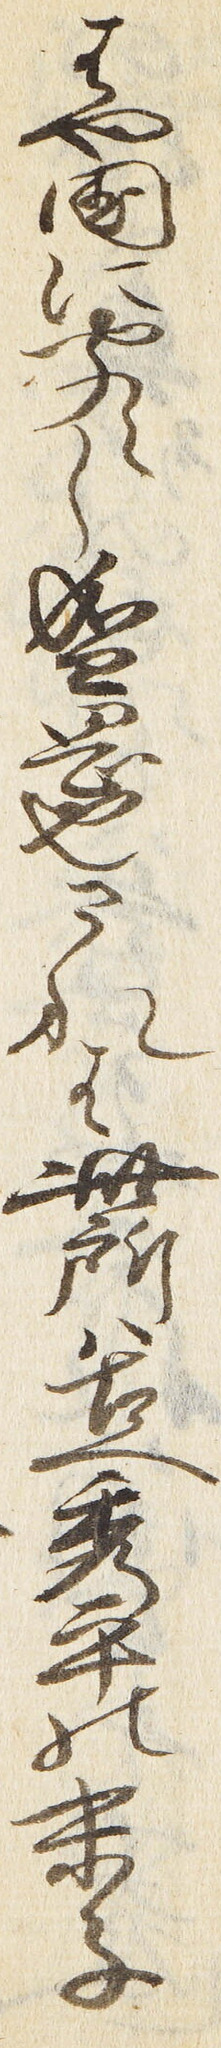はや国に聞えし盛岡也されは此所は古へ秀平の末子
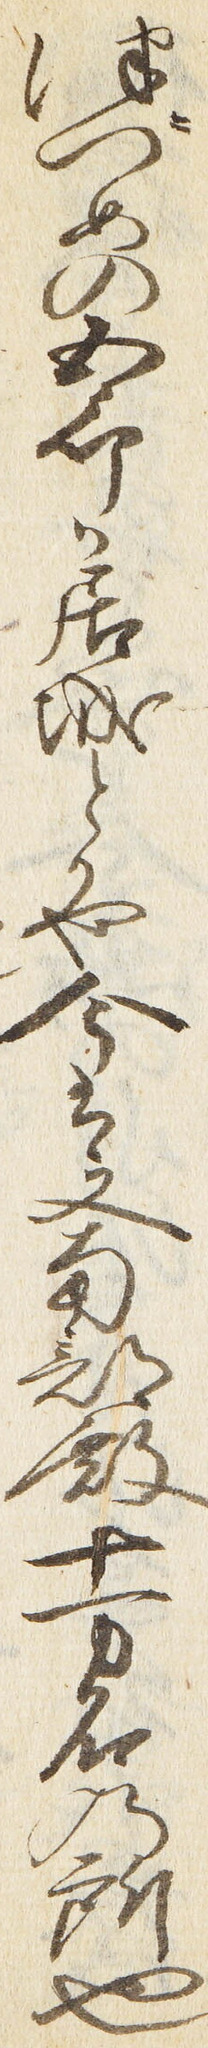つづめの五郎か居城とかや今は又南部殿十万石の所也
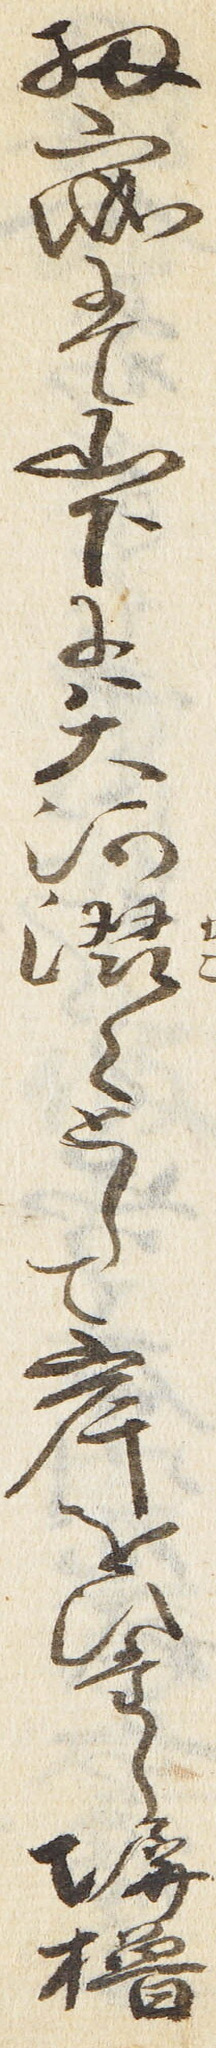扨山城にて山下には大河々として岸をひたし塀櫓
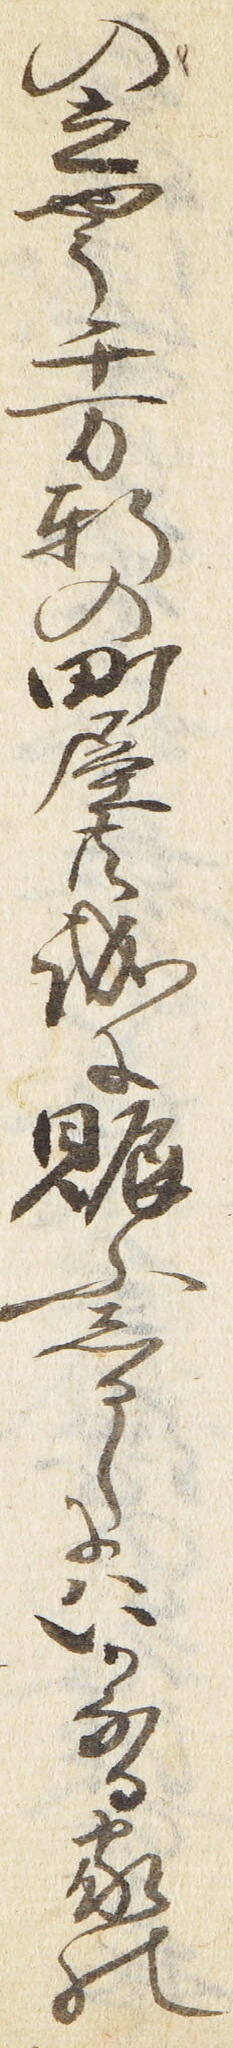の立やう千万軒の町屋共誠に賑ふしるしにはいかなる家の
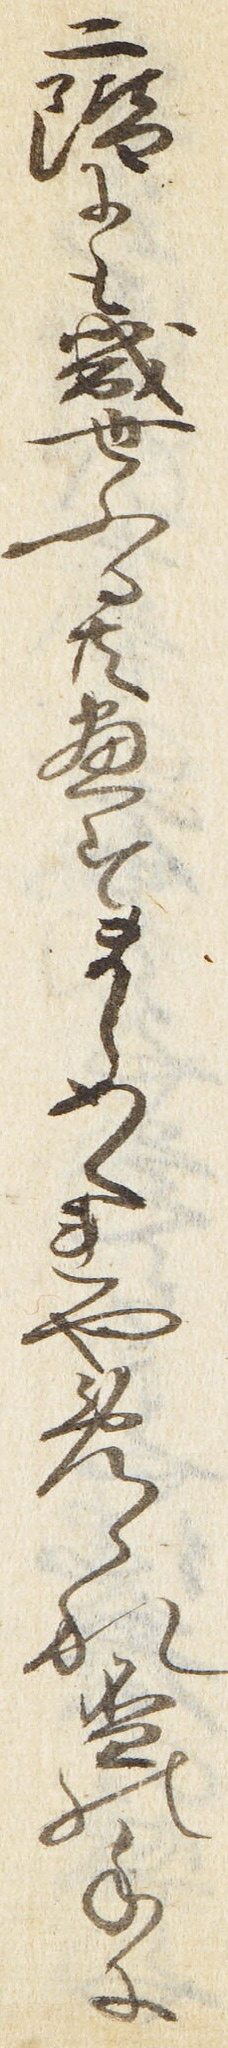二階にも幾世ふる共尽すましめくれやめられ盃の手に
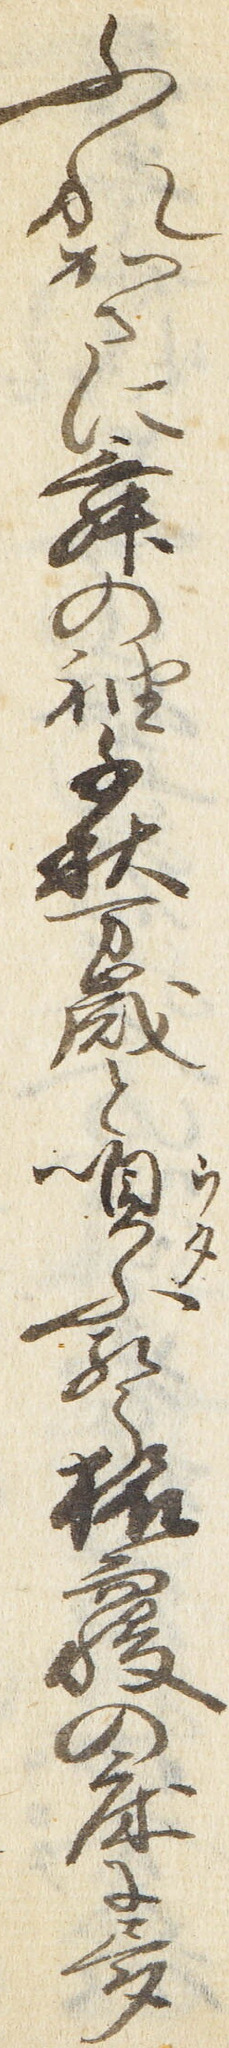ふれかさに舞の袖千秋万歳と唄ふ声旅寝の床に夢
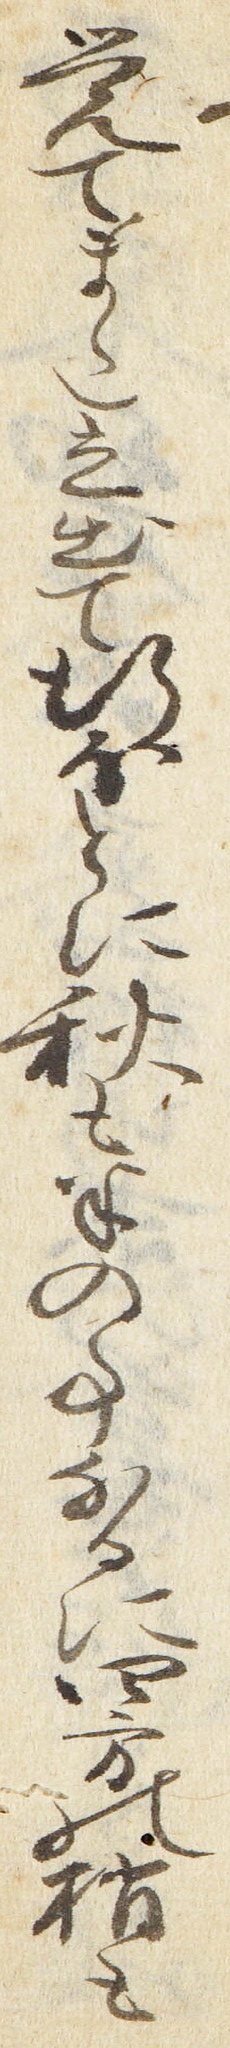覚てまた立出て行ほとに秋も半の事なるに四方の梢も

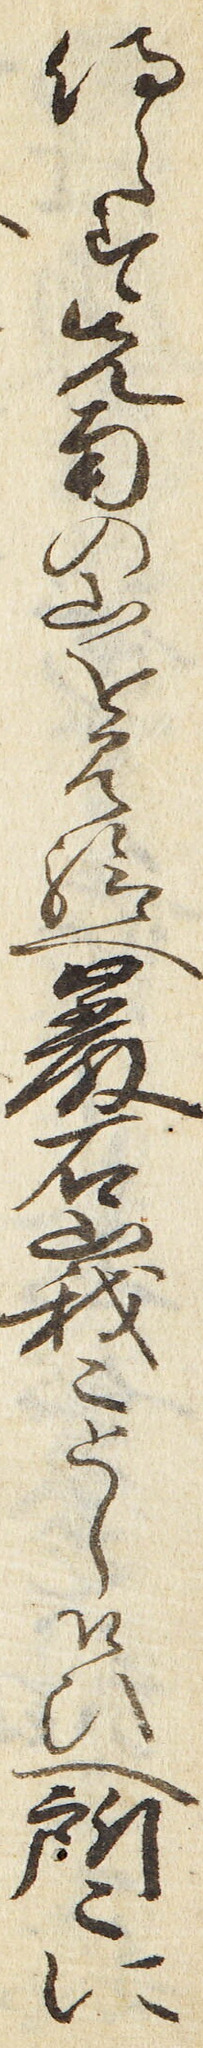侍らす先南の山を見給へ巌石峩々としそひへ所々に
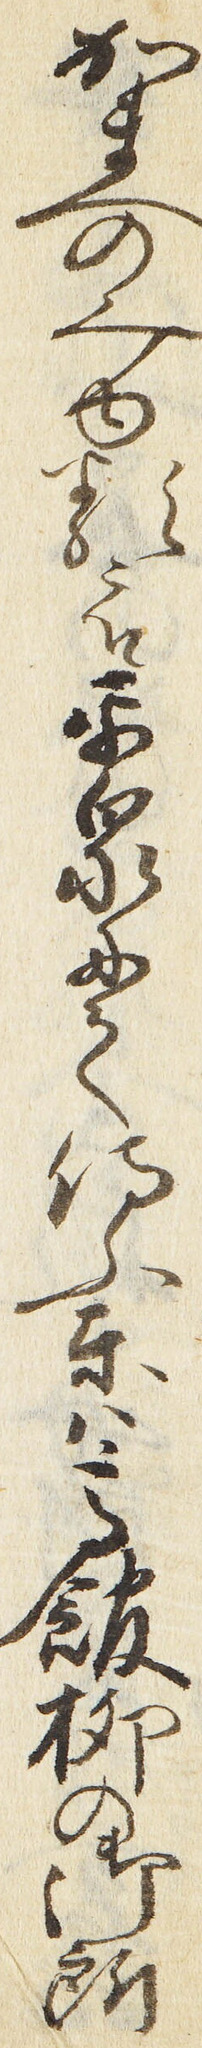かまへのみゆるこそ平泉にて侍ふ東は高館柳の御所
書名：海陸世話日記
